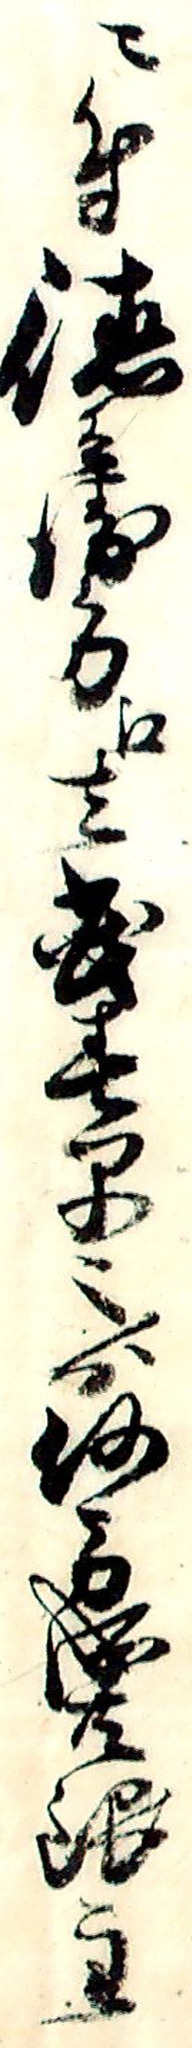ニ付徳兵衛方江者當春早々ゟ何方成共銀主
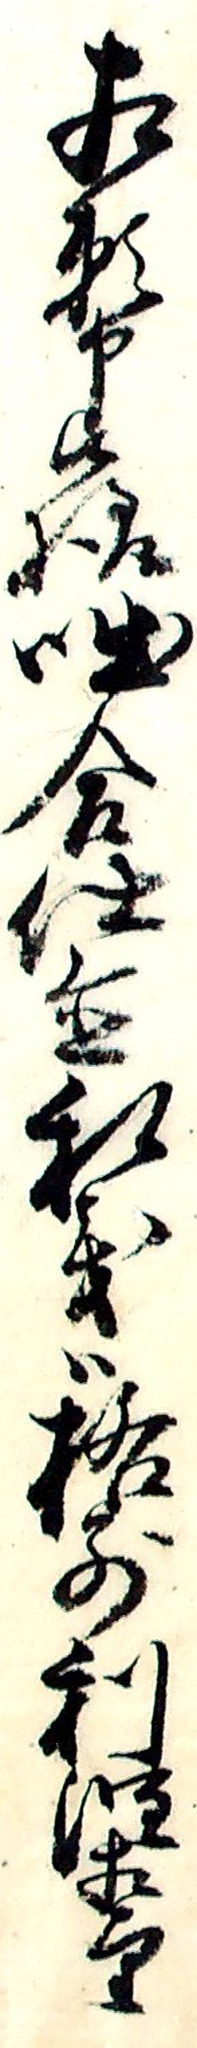相願申候様咄合仕置私義ハ格別利潤相望
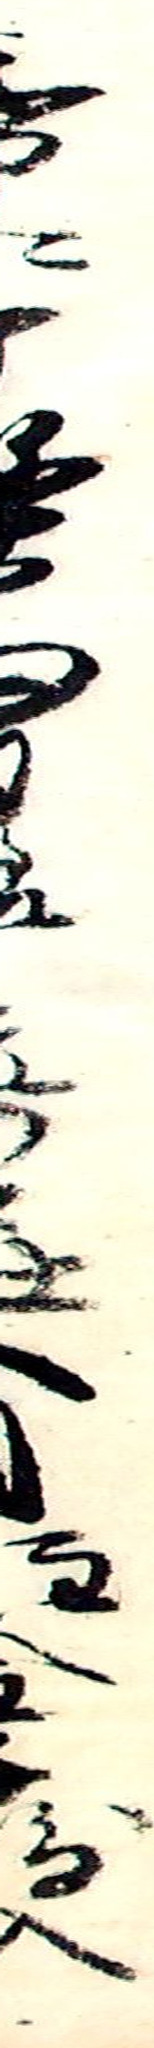不申ニ付質物同様之姿ニ仕入用程金子指入

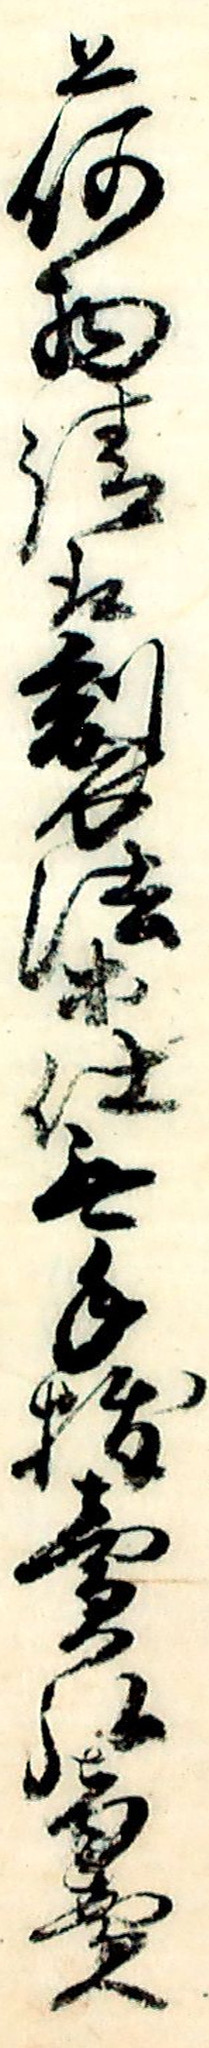荷物請取製法等仕無手抜賣弘商賣
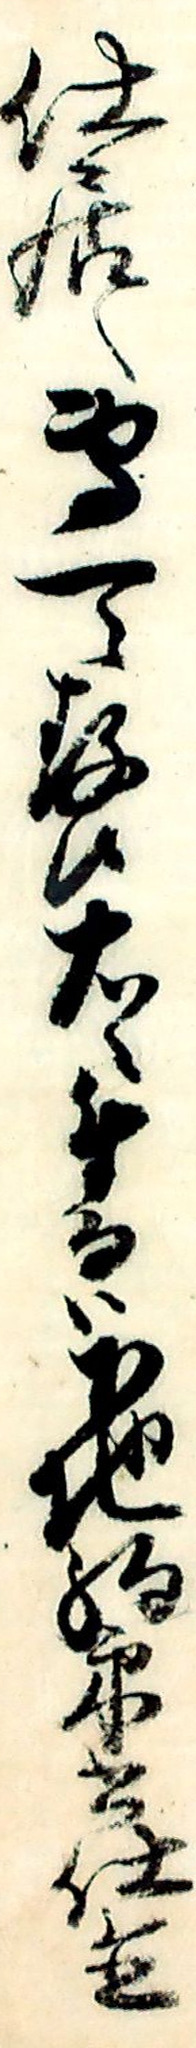仕居之専一ニ存候右ニ付而ハ下地約束書仕置
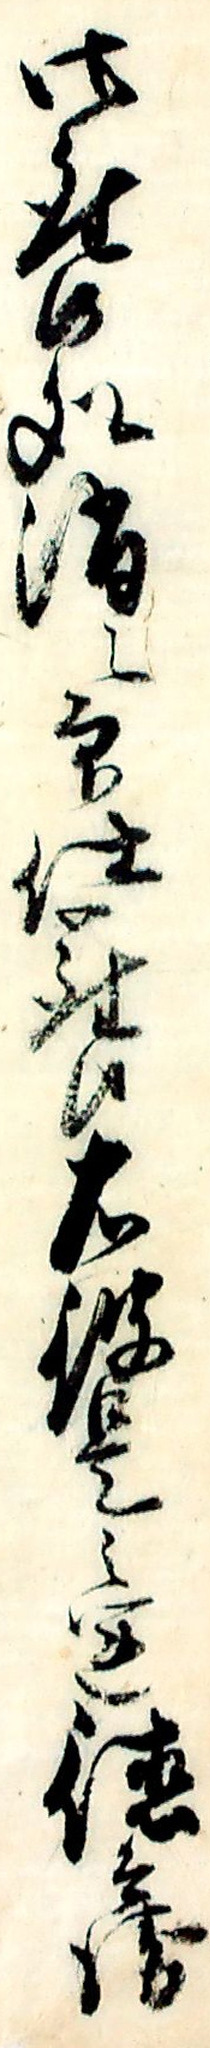御座候処消し印仕御座候右彼是之運徳兵衛
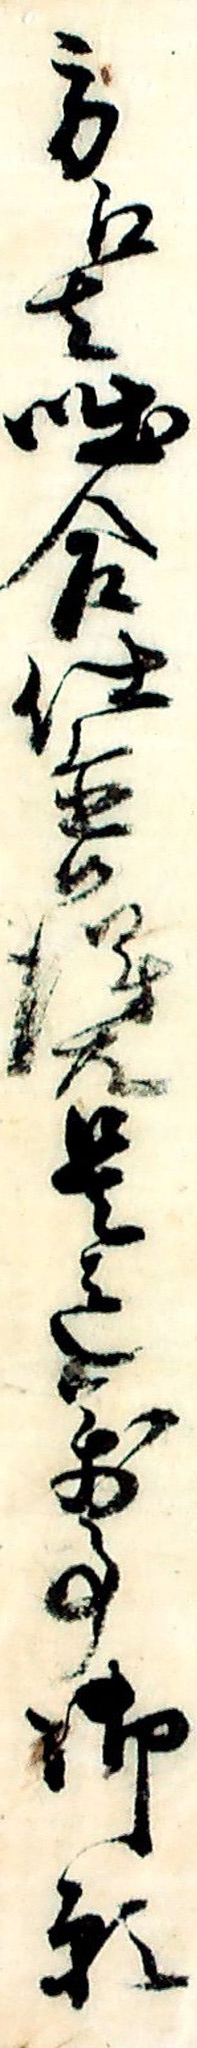方江者咄合仕置候得共是迄萬事御願
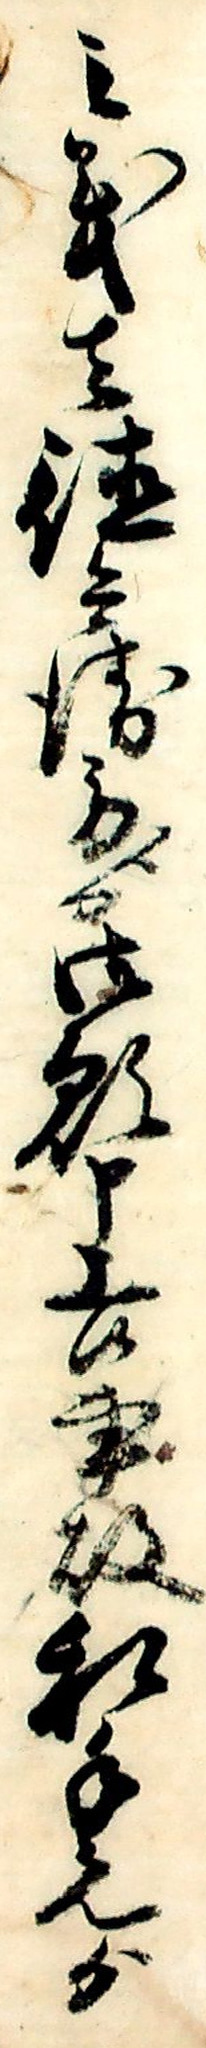之義者徳兵衛方ゟ御願申上候事故私手元ゟ
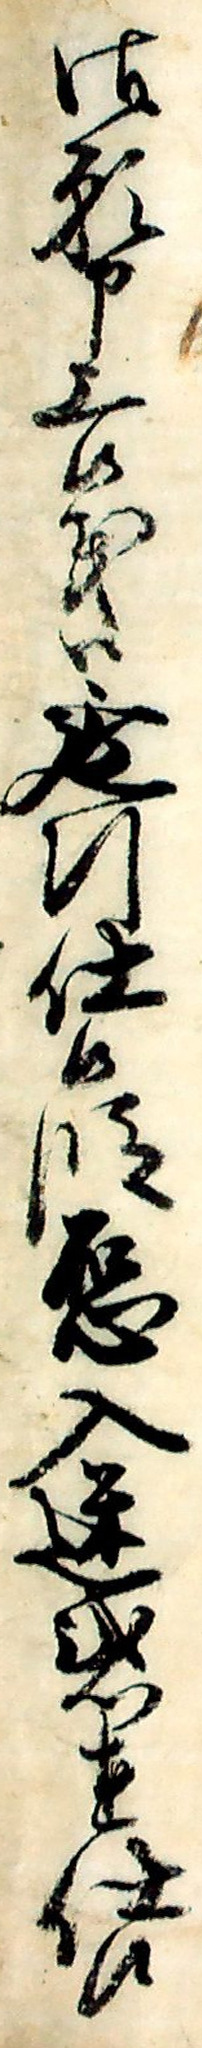御願申上候義ハ延引仕候段恐入迷惑奉仕候
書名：奉申上覚（山城谷漆仕入買入銀主之義に付）
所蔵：鳴門教育大学 Naruto University of Education
